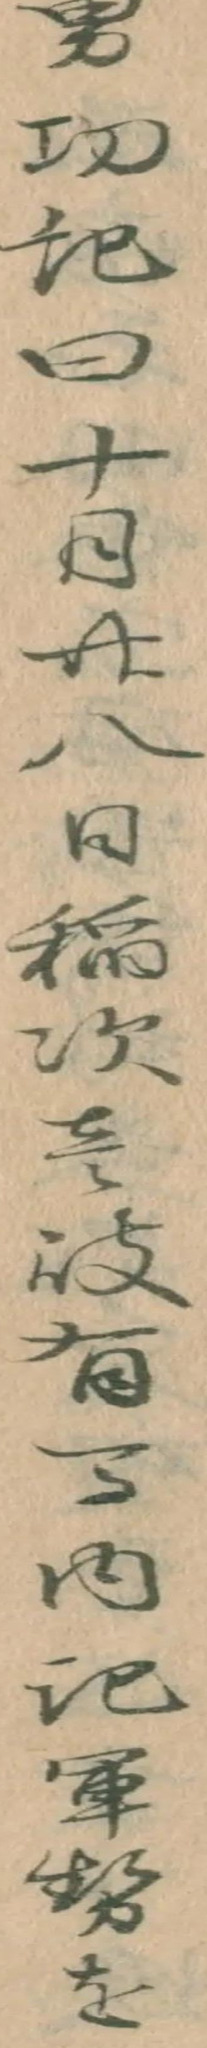勇功記曰十月廿八日稲次壱岐有馬内記軍勢を
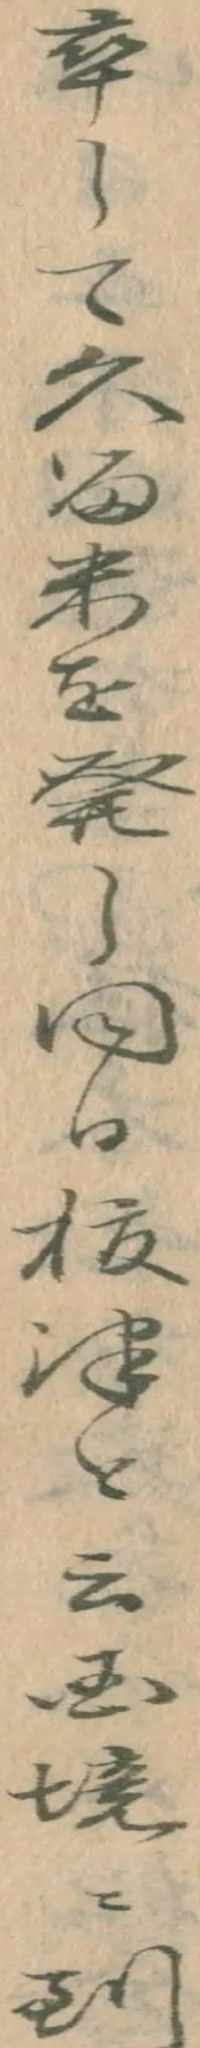卒して久留米を発し同日抜津と云国境に到

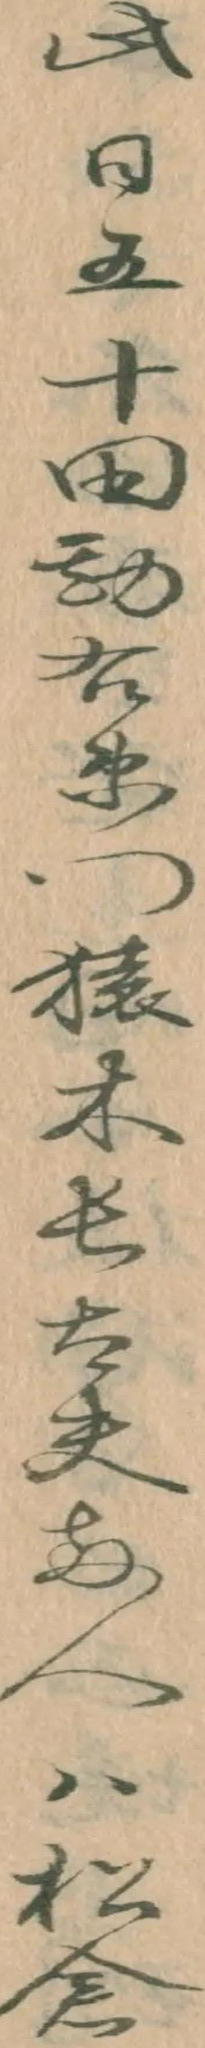此日五十田勘右衛門猿木長太夫両人は松倉
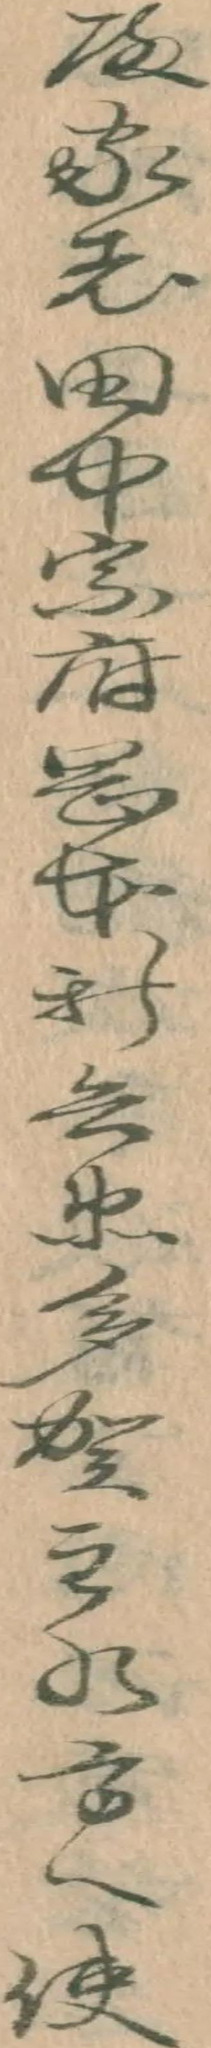殿家老田中宗府岡本新兵衛多賀主水方へ使
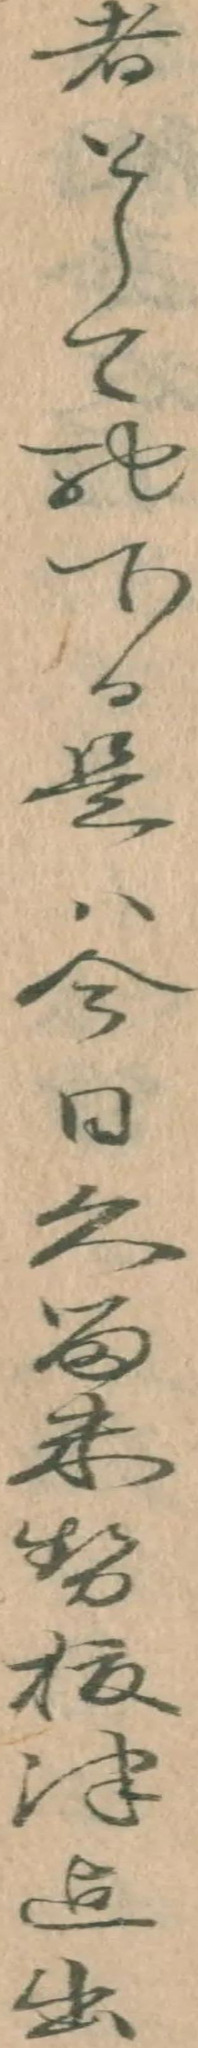者として馳下る是は今日久留米勢抜津迄出
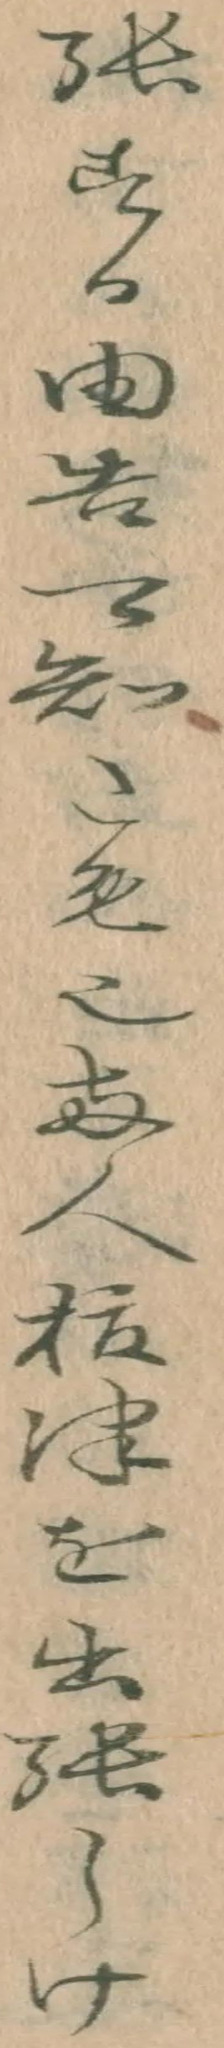張春る由告可知た免也両人抜津を出張しけ
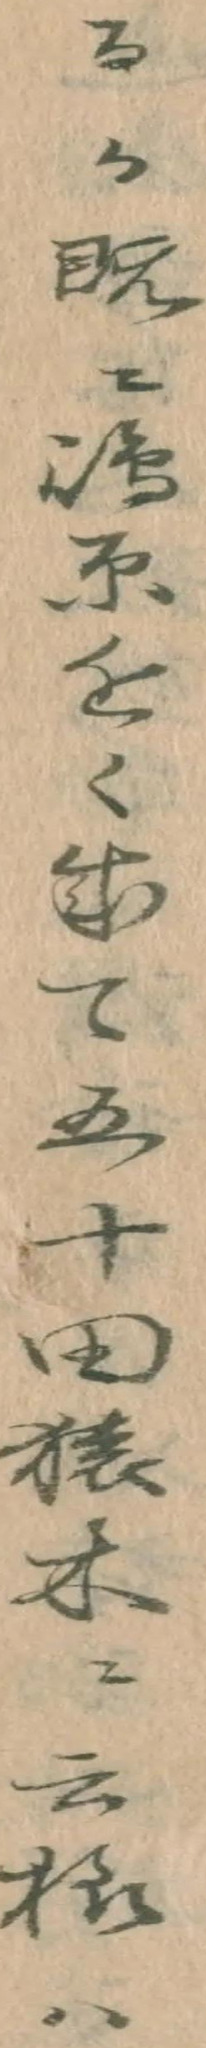るか既に島原近く成て五十田猿木に云様は
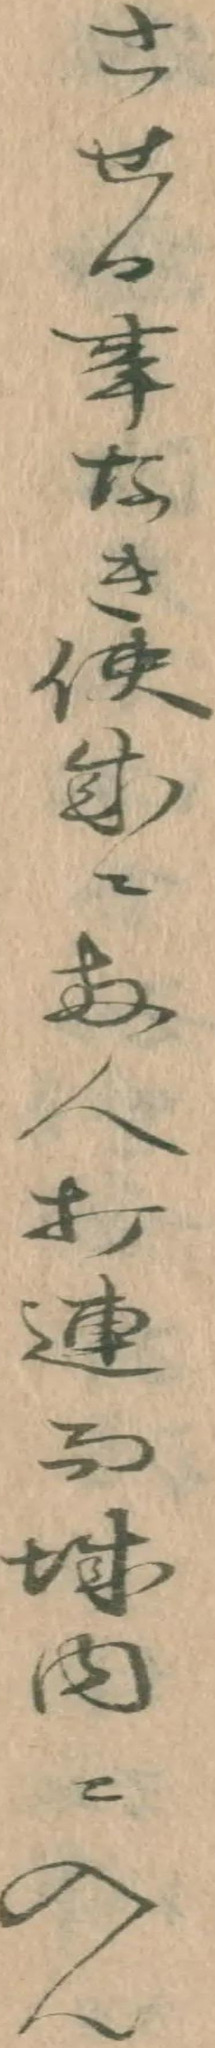させる事なき使成に両人打連而城内に入ん
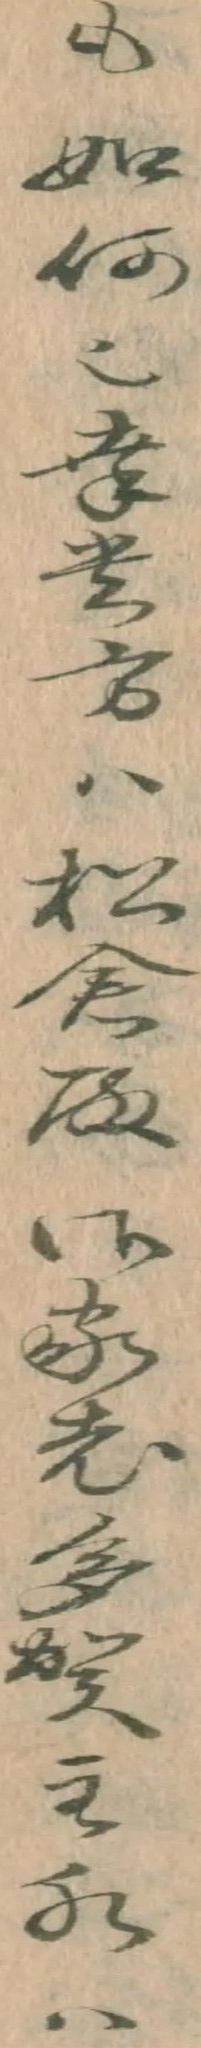も如何也幸貴方は松倉殿御家老多賀主水は
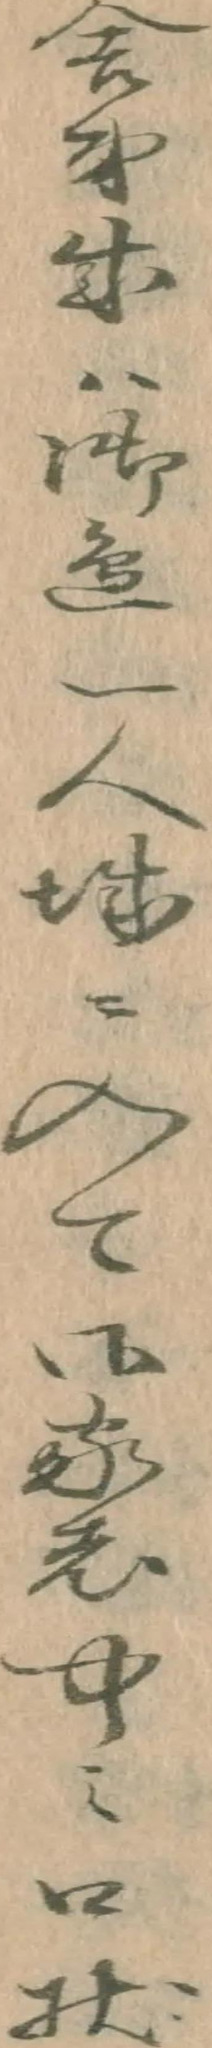舎弟成は御辺一人城に入て御家老中之口状
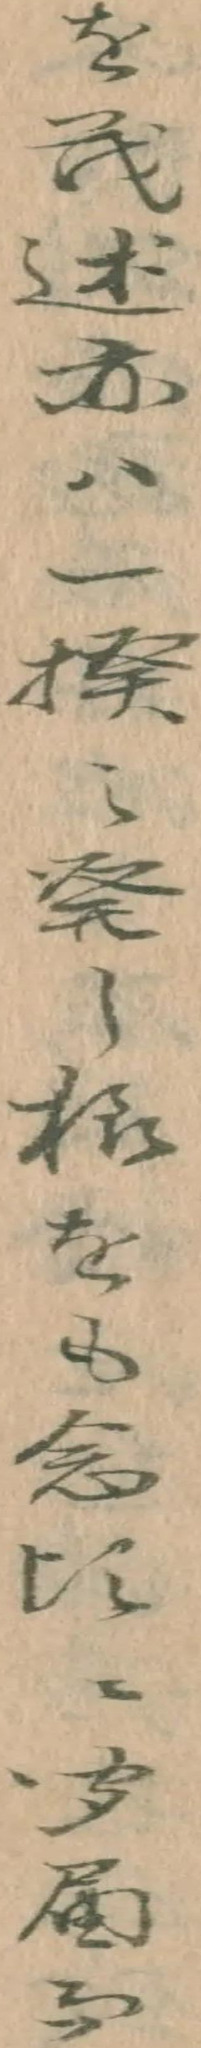を茂述亦は一揆之発し様をも念頃に聞届而
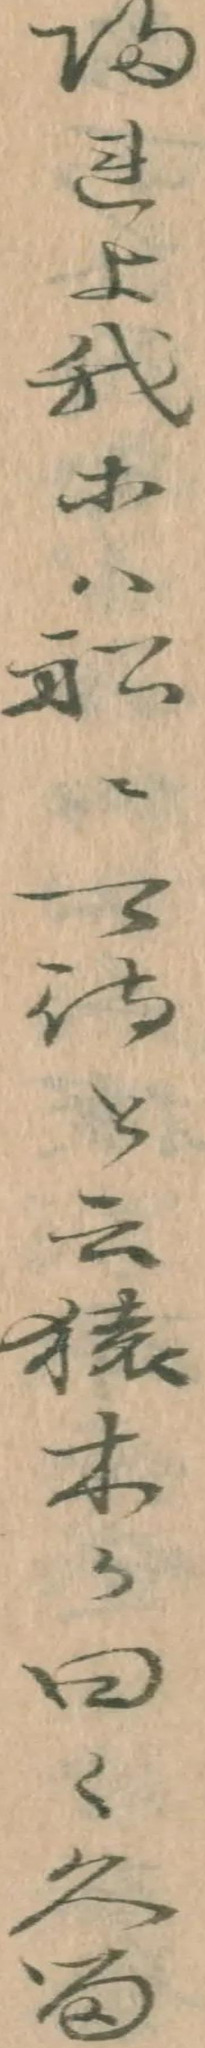帰連よ我等は舩に可待と云猿木か曰く久留
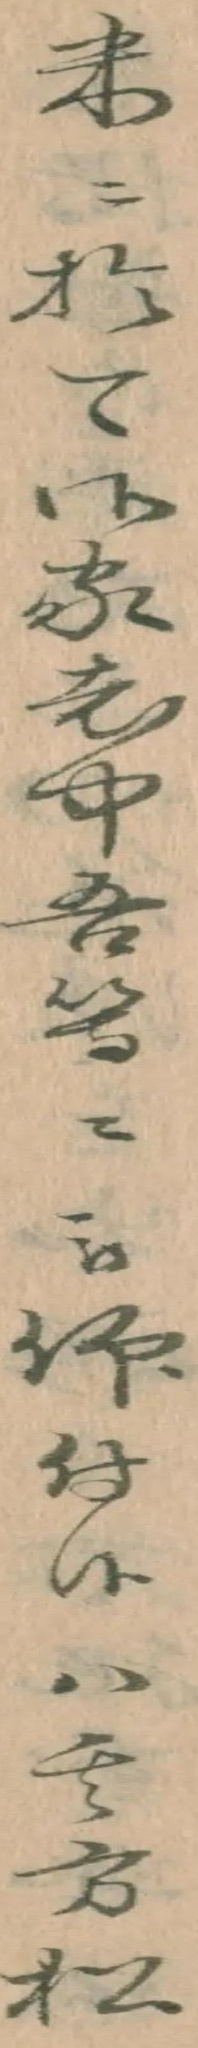米に於て御家老中吾等に被仰付候は其方松
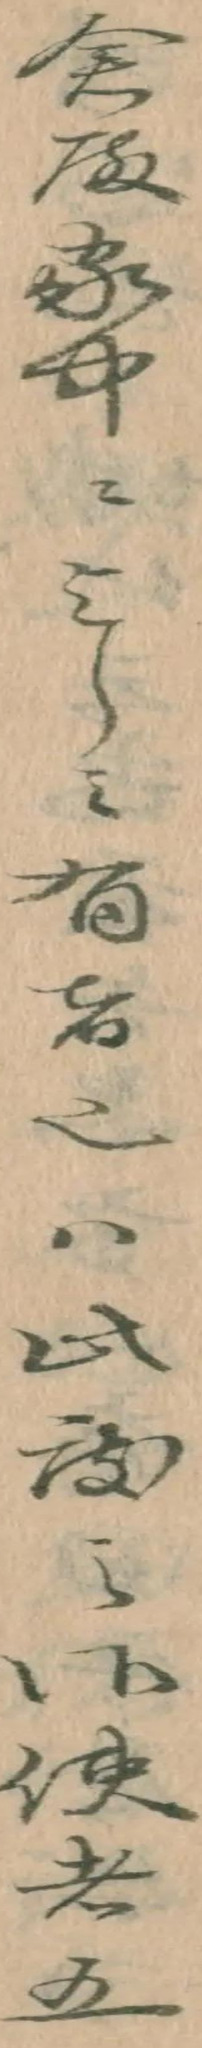倉殿家中に与し之有者也は此度之御使者五
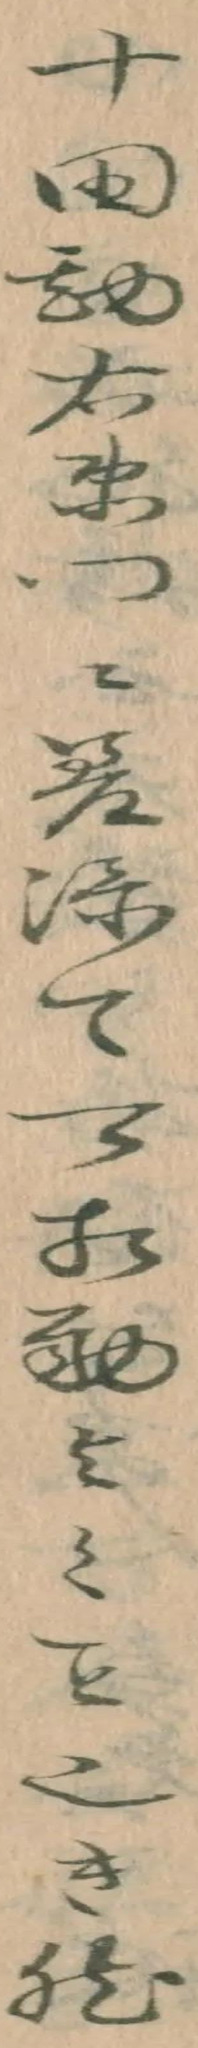十田勘右衛門に差添て可相勤与くと也き然
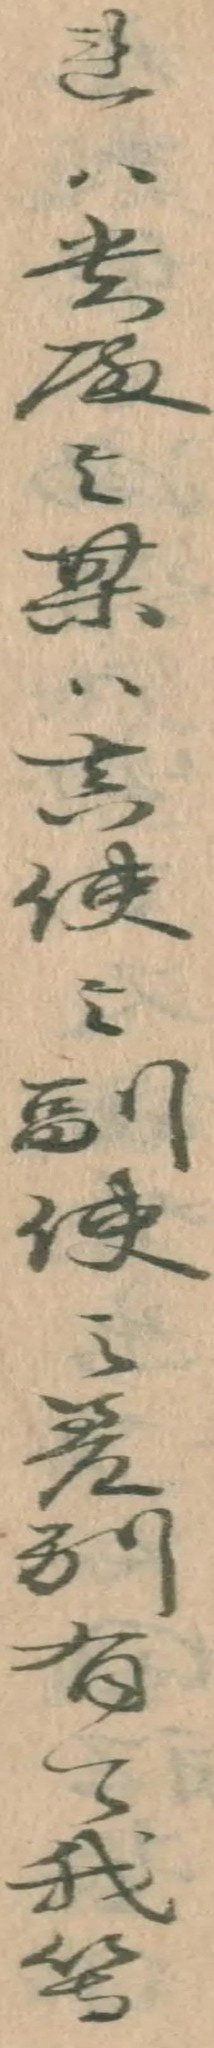連は貴殿与某は真使与副使之差別有て我等
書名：切支丹御退治記 49巻. [2]
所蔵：国立国会図書館 National Diet Library, JAPAN
